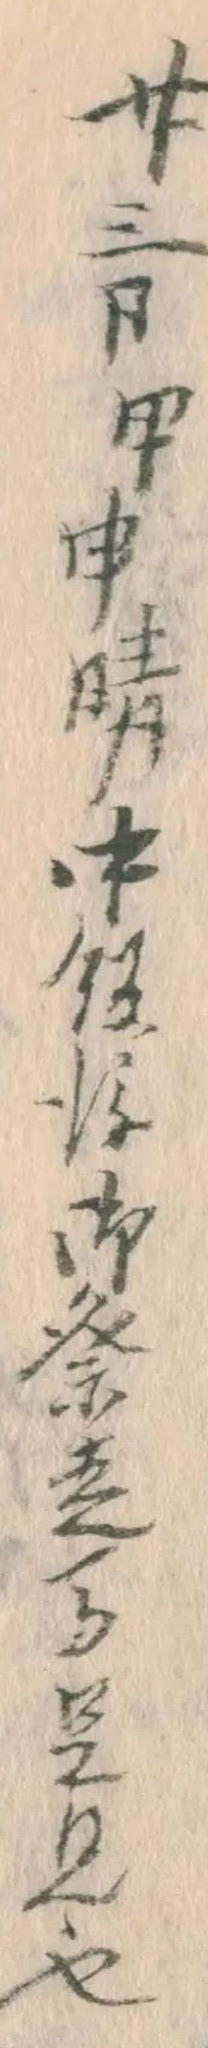廿三日甲申晴中飯後御祭走馬足見也
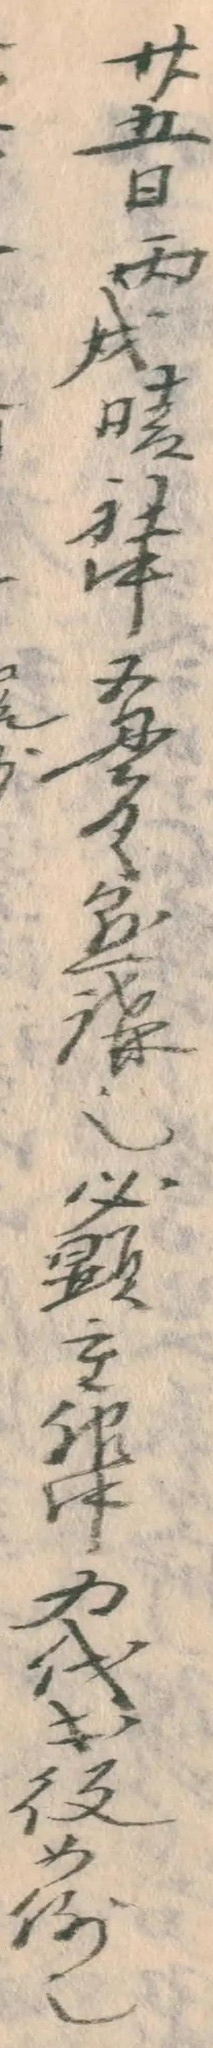廿五日丙戌晴社中五貫匁懸講也必顕重服中為代出役如例也
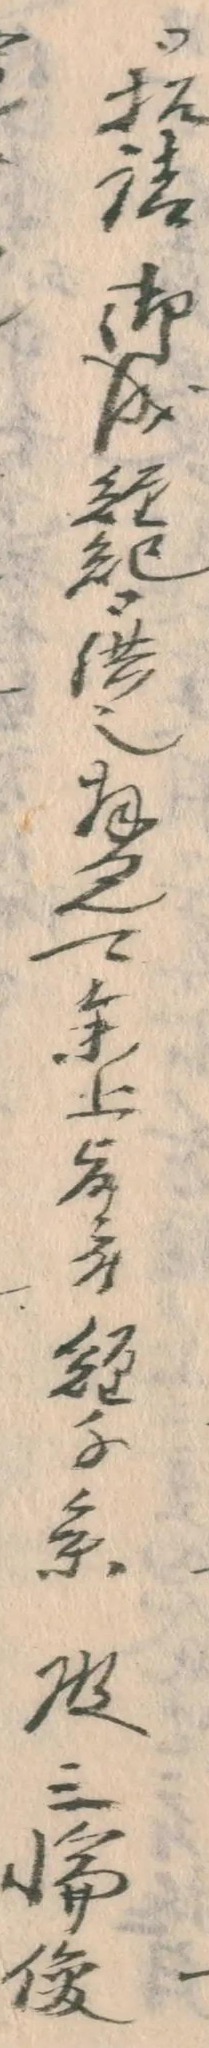御招請御成経紀御供也拝見可参上旨ニ付経千参殿三輪俊
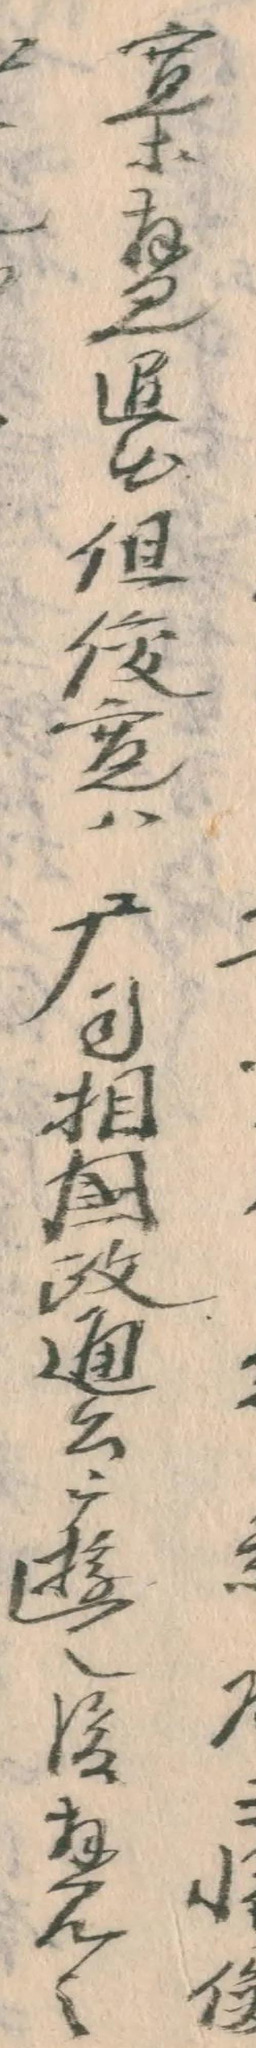宣等拝見退出但俊寛ハ鷹司相国改通公被遊之後拝見也
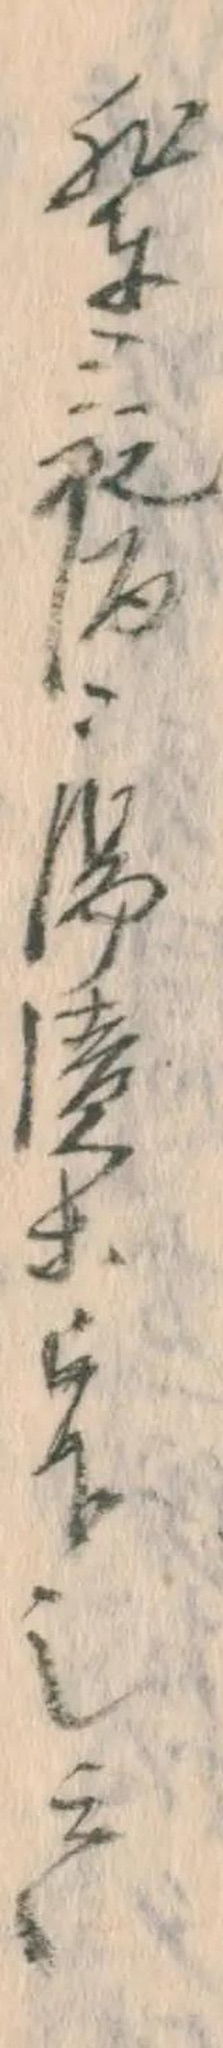輩御祝酒御湯漬等被下云々
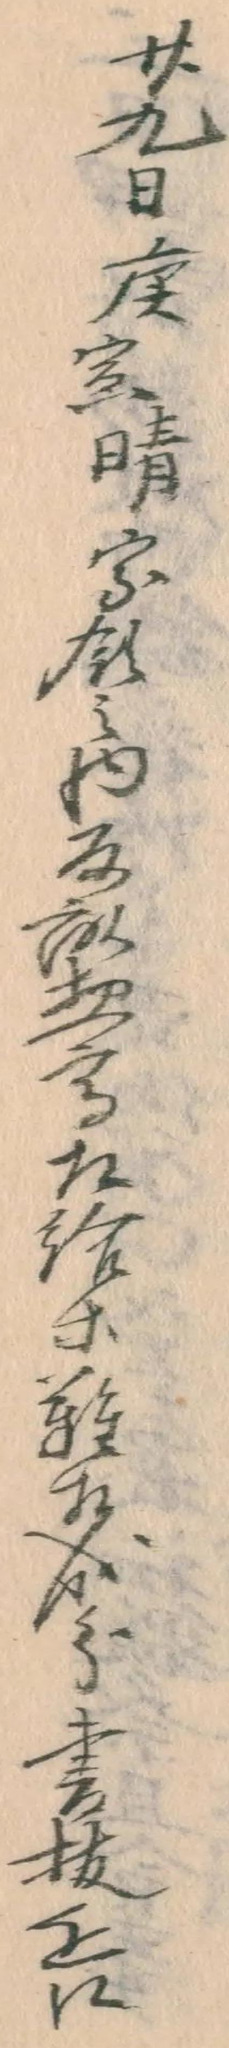廿九日庚寅晴家領之内夏畝惣高相給等難相成分書抜近江
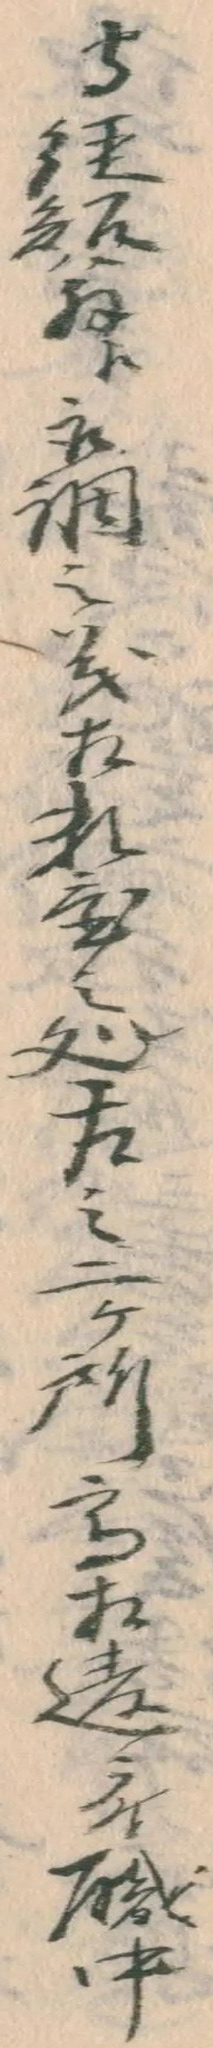守経紹翁え取調之義相頼置之処左之二ケ所高相違ニ付職中
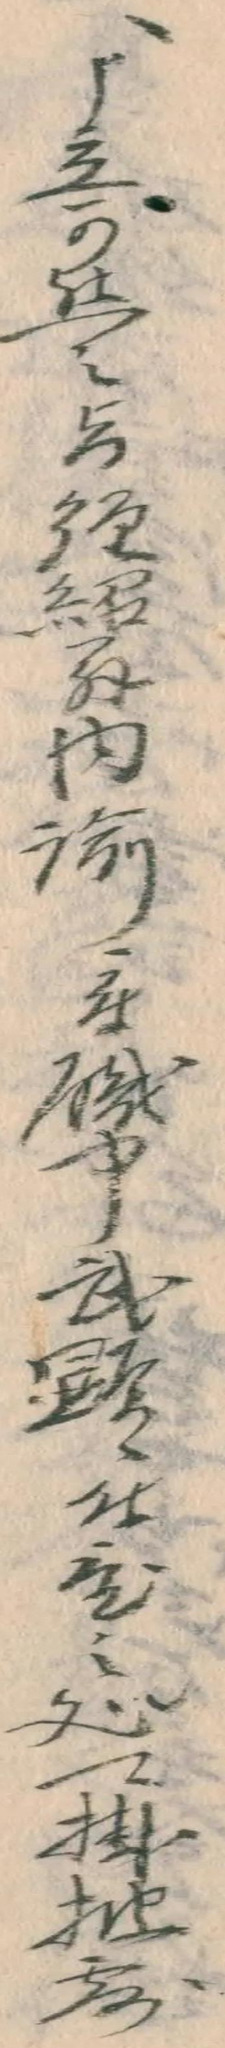へ申立可然之旨経紹翁内諭ニ付職中武顕へ付置之処可掛披露
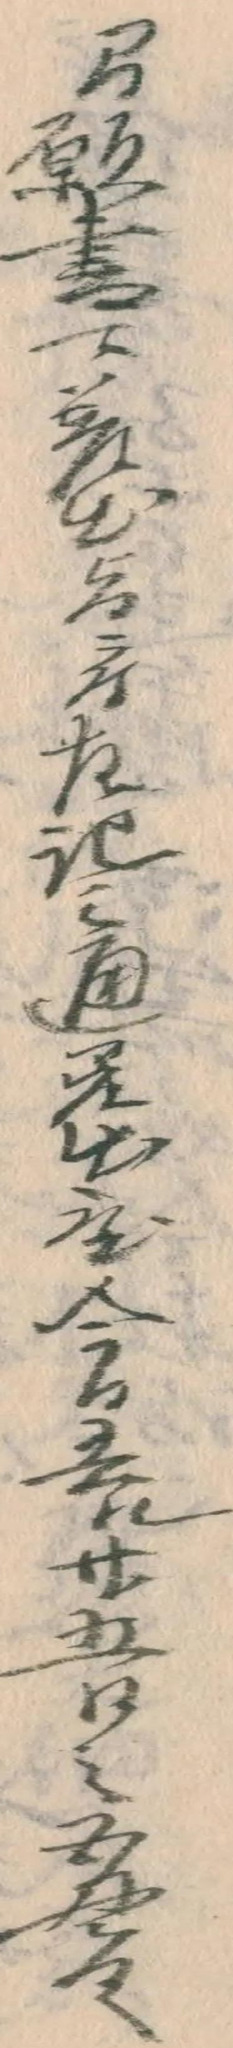間願書可差出旨ニ付左記之通差出置今日去ル廿五日之五貫匁
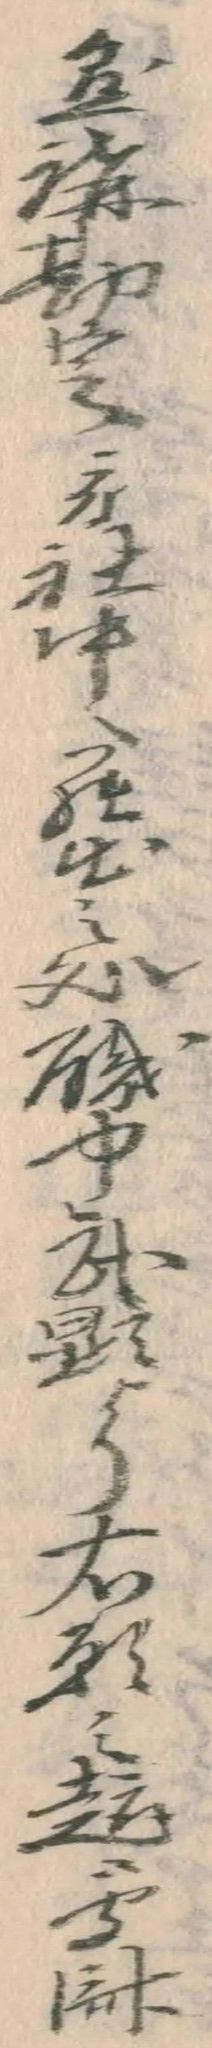懸講勘定ニ付社中へ罷出之処職中武顕より右願之趣御聞済
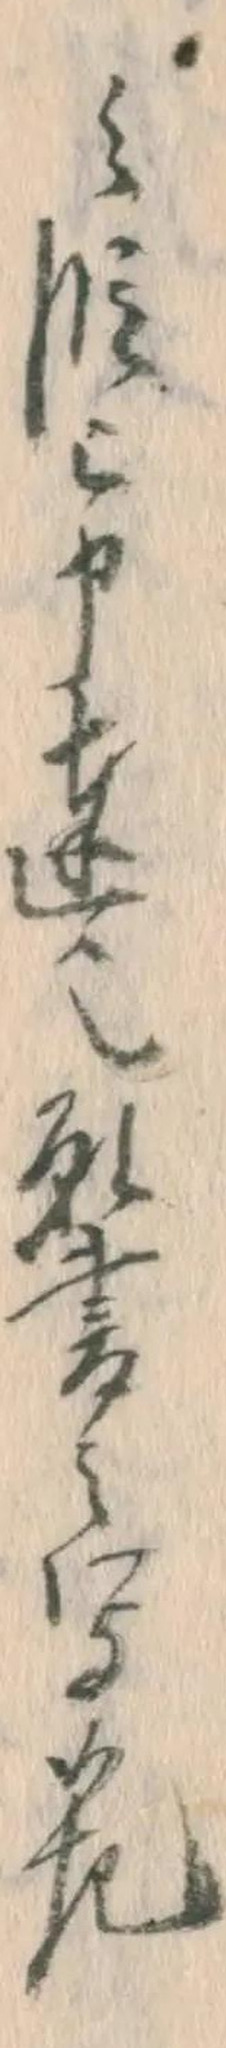之段被申達也願書之写如左
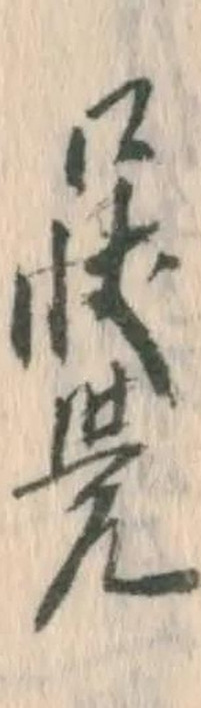口状覚
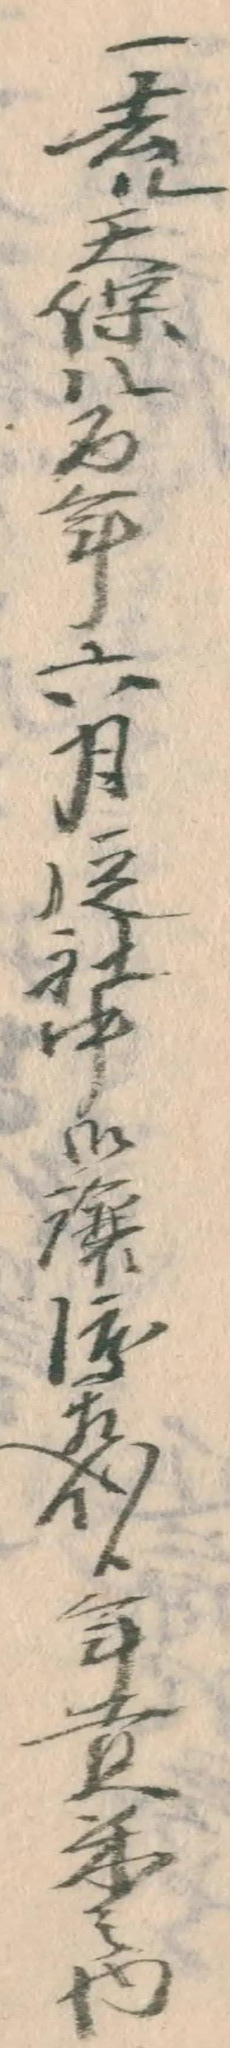一去ル天保八酉年六月従社中御譲渡相成候年貢米之内
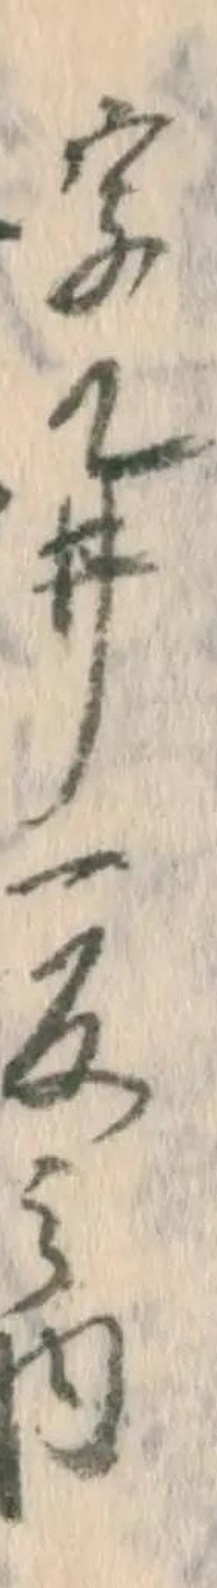字乙井一反之内
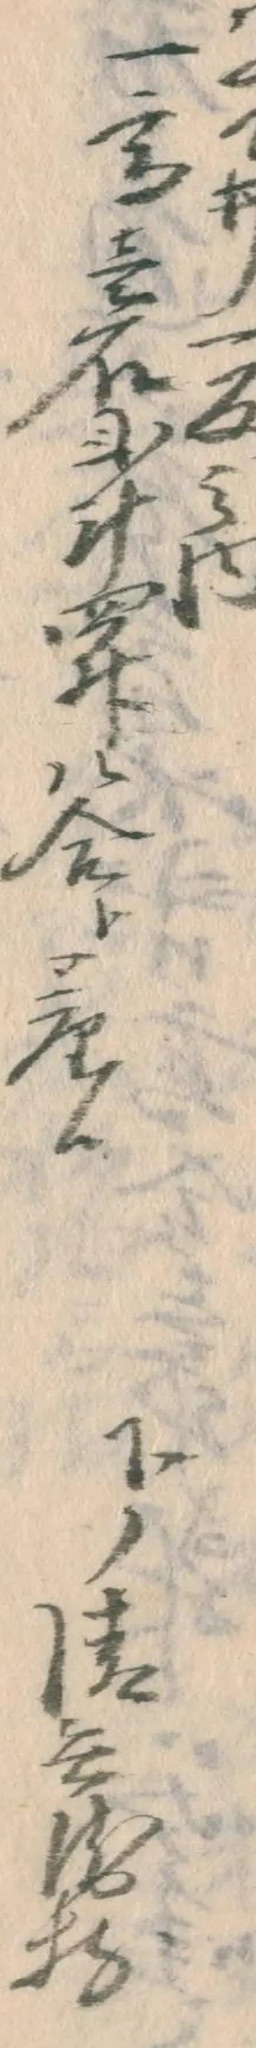一高壱石弐斗四升八合ト御座候下ノ清兵衛持
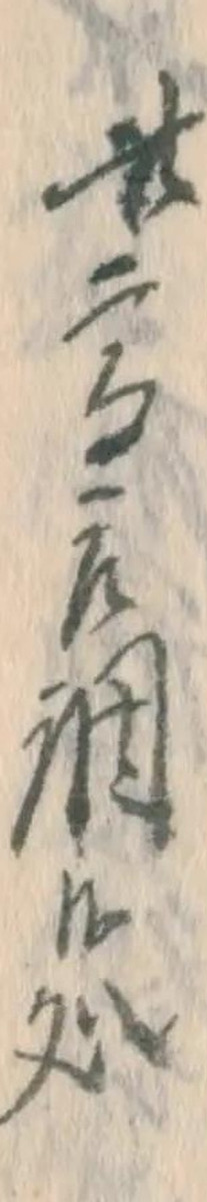此高取調候処
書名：賀茂社記録. 第70冊
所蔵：国立国会図書館 National Diet Library, JAPAN
